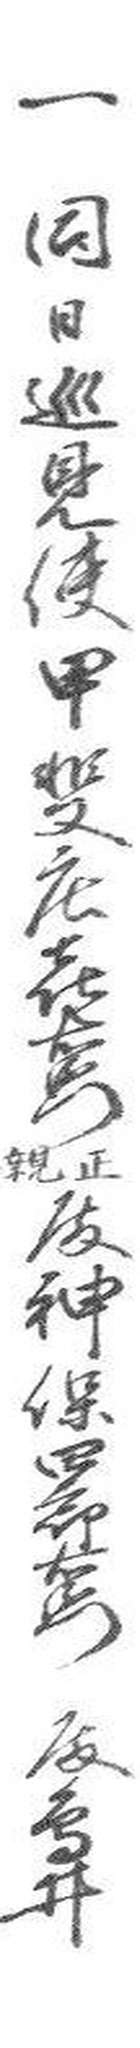一同日巡見使甲斐庄喜右衛門正親殿神保四郎右衛門殿鳥井
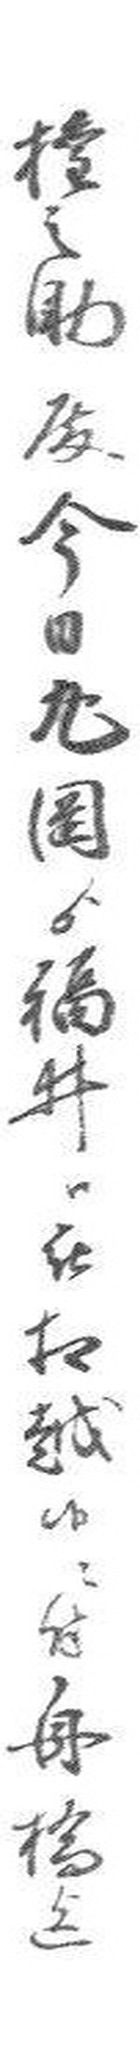権之助殿今日丸岡ゟ福井江被相越候ニ付舟橋迄
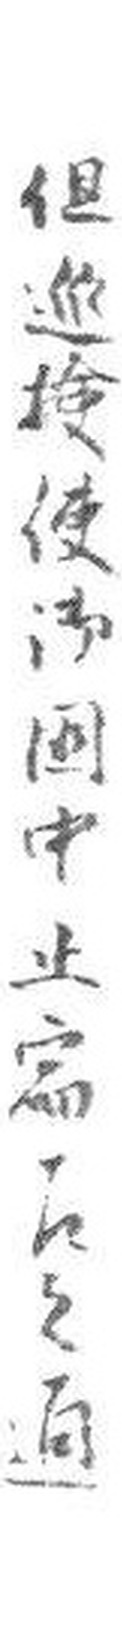但巡見使御国中止宿左之通
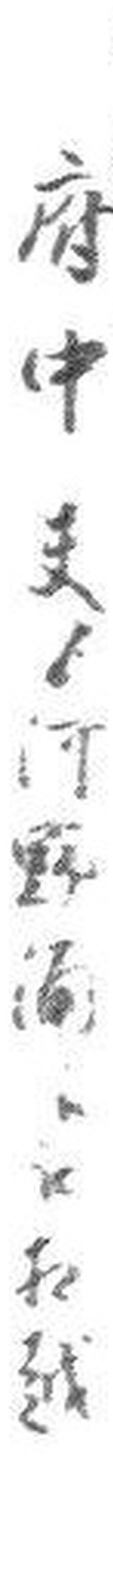府中夫ゟ河野浦江被相越
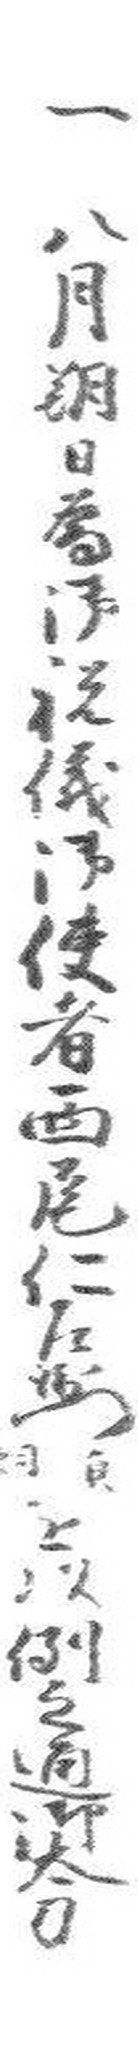一八月朔日為御祝儀御使者西尾仁左衛門貞嗣を以例之通御太刀
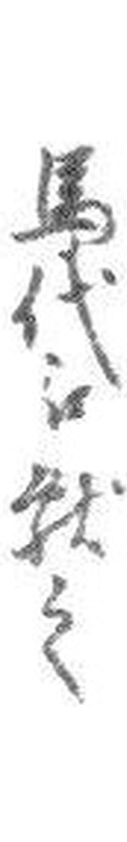馬代被献之
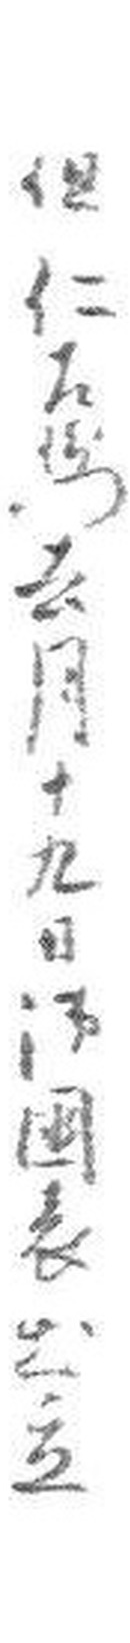但仁左衛門去月十九日御国表出立

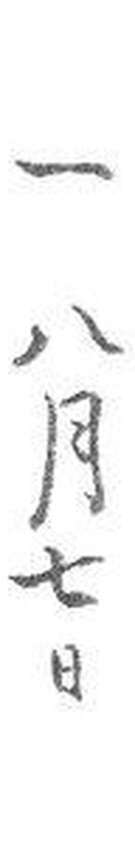一八月七日
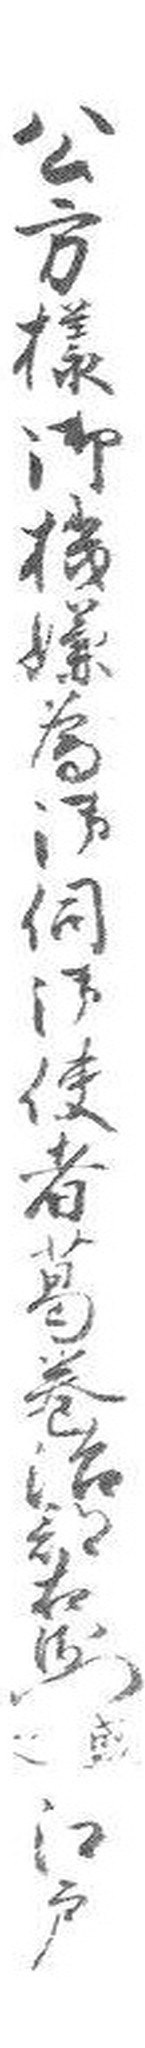公方様御機嫌為御伺御使者葛巻治部右衛門盛之江戸
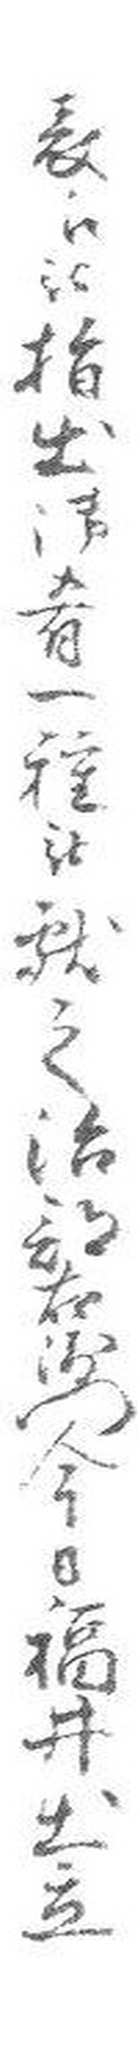表江被指出御肴一種被献之治部右衛門今日福井出立
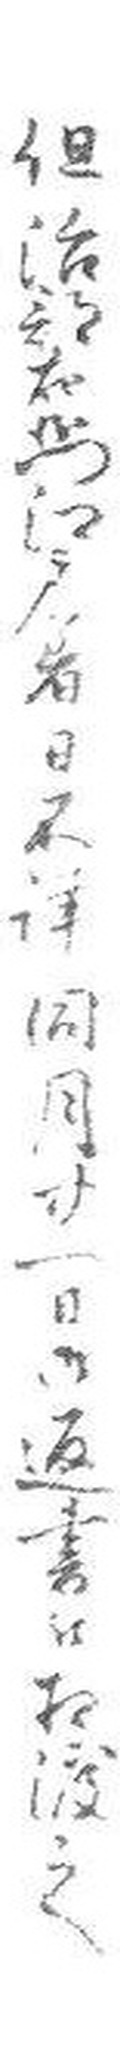但治部右衛門江戸着日不詳同月廿一日御返書被相渡之
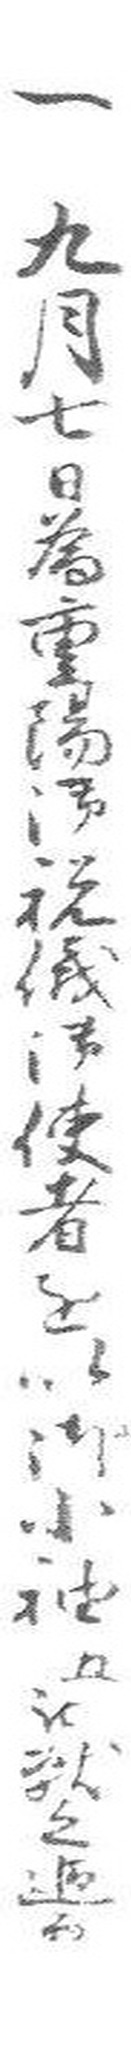一九月七日為重陽御祝儀御使者を以御小袖五被献之追而
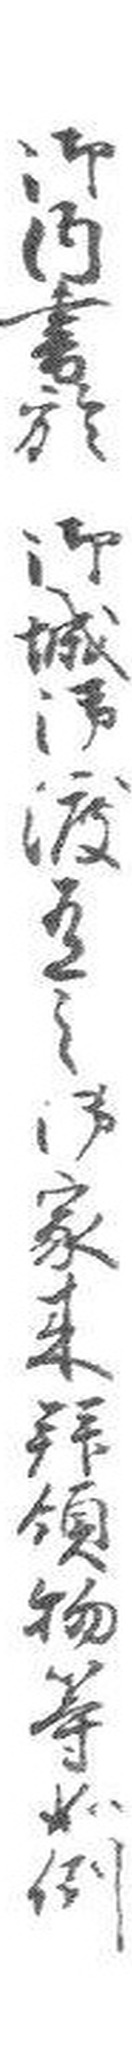御内書於御城御渡有之御家来拝領物等如例
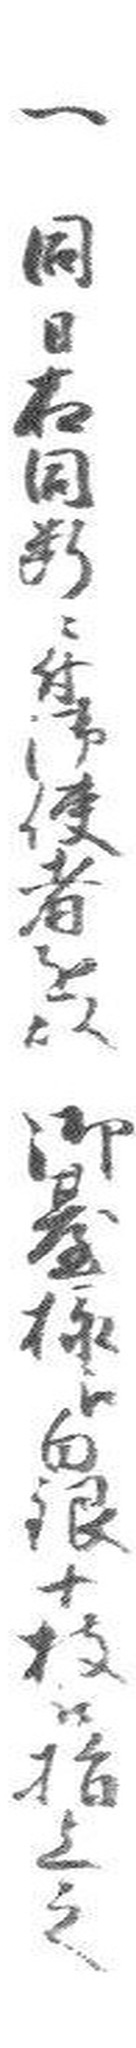一同日右同断ニ付御使者を以御台様江白銀十枚被指上之
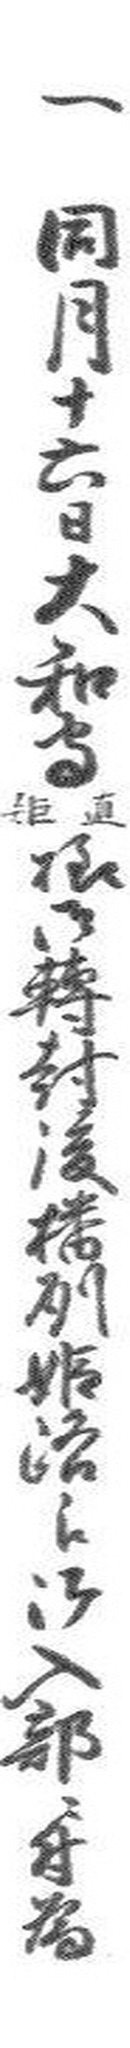一同月十六日大和守直矩様御転封後播州姫路江御入部ニ付為
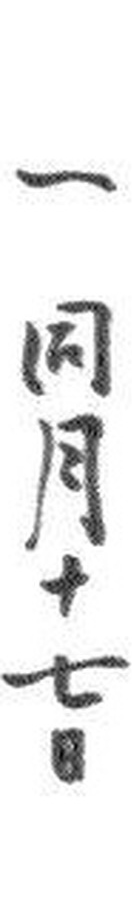一同月十七日
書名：家譜 七 光通公 従寛文四年到同九年
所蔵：福井県文書館 Fukui Prefectural Archives
